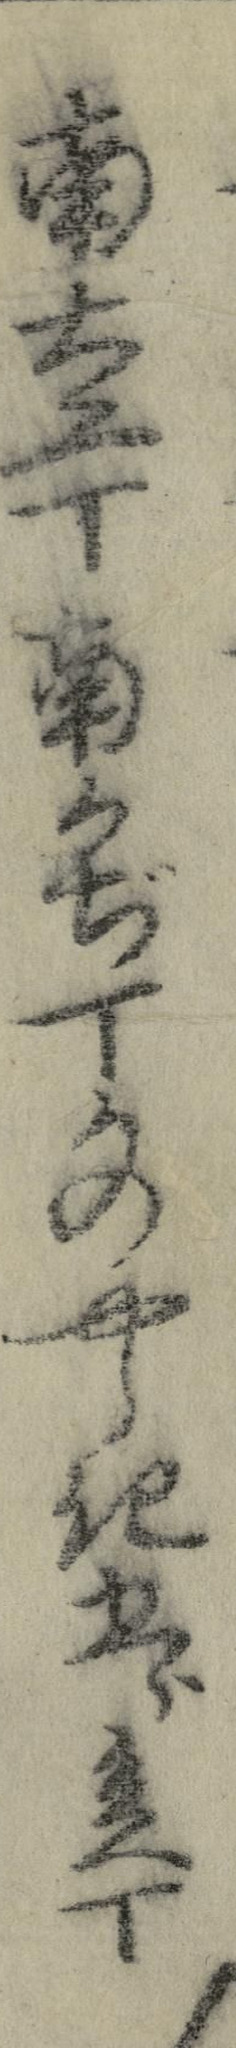南大工丁南かぢ丁かのやしき五郎兵へ丁
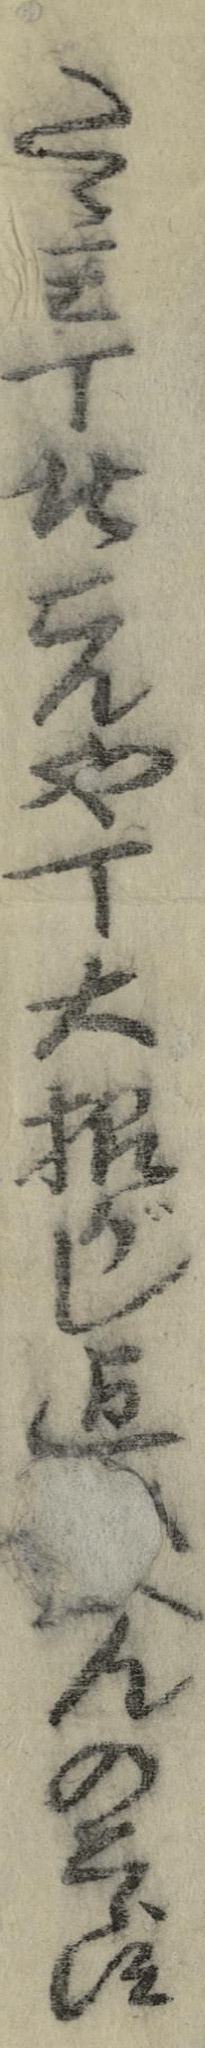たゝミ丁北こんや丁大根がし迄一ゑんのこらず
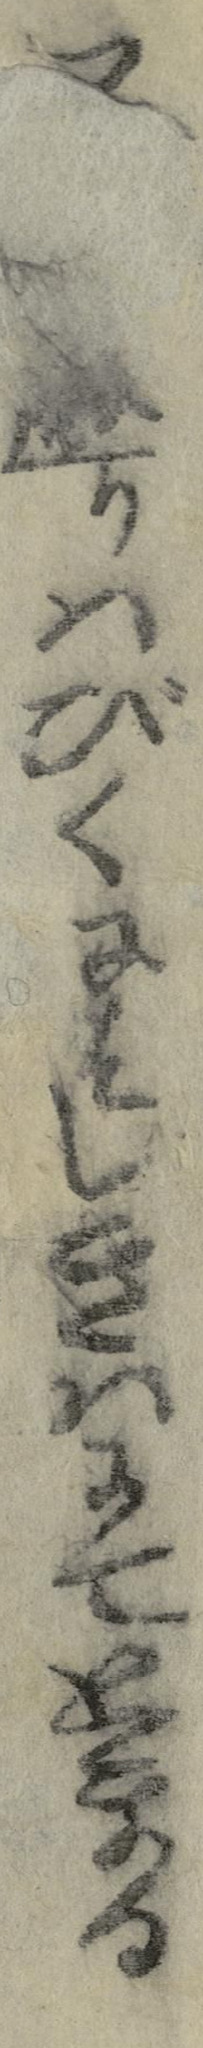又通りハびくにはしきハにてとまる
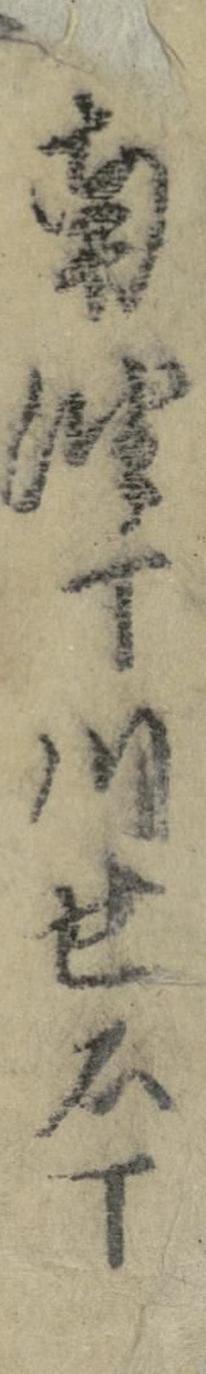南油丁川せ石丁
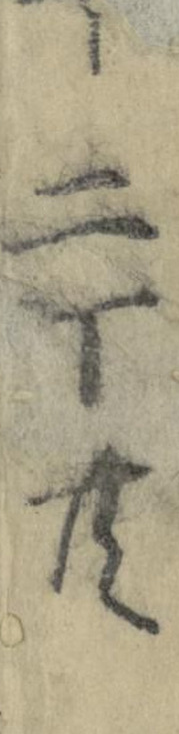二丁共
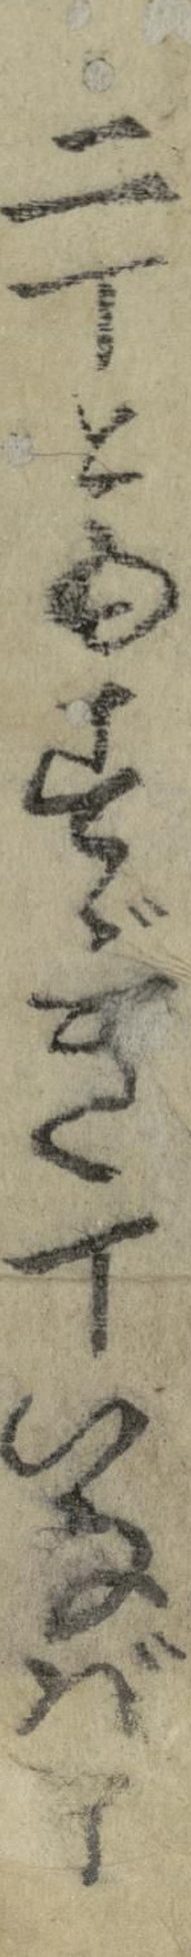二丁ともすゞき丁いなバ丁
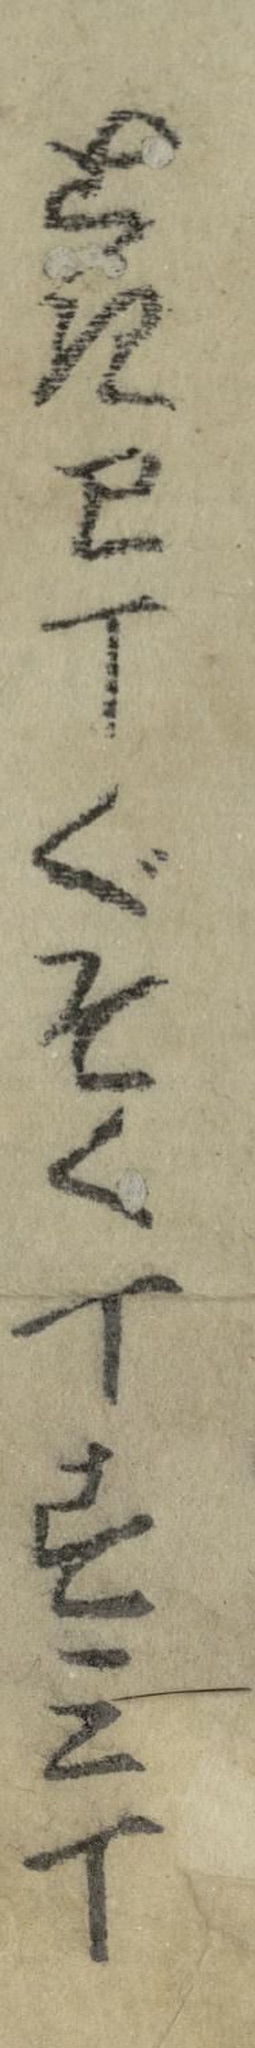ときわ丁ぐそく丁すミ丁
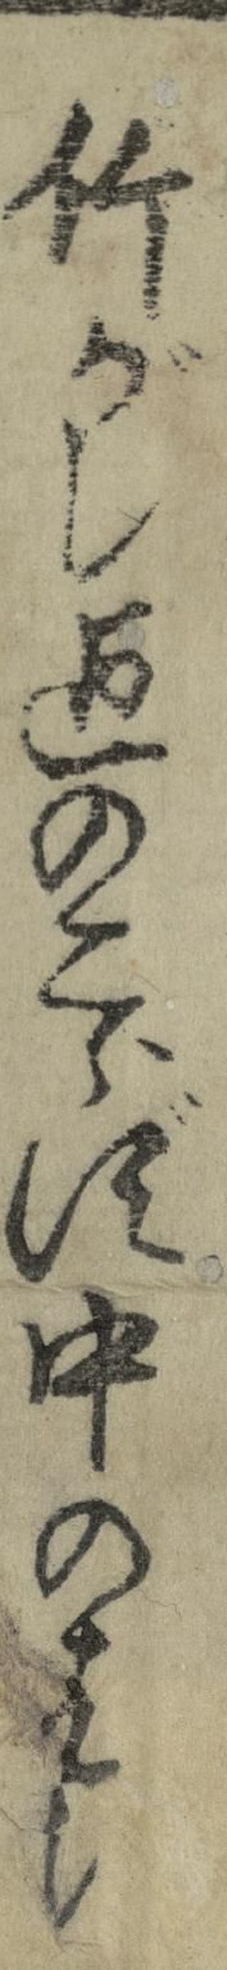竹かし迄のこらず中のはし
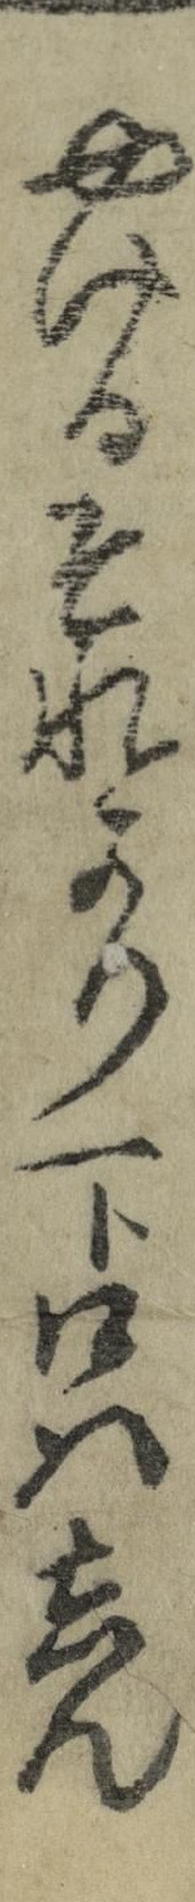やけるそれより一ㇳ口ハしん
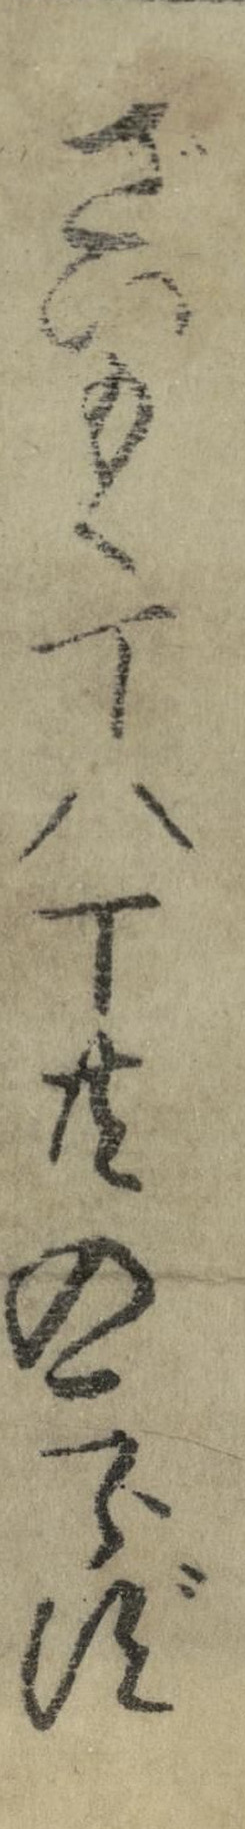さいもく丁八丁共のこらず
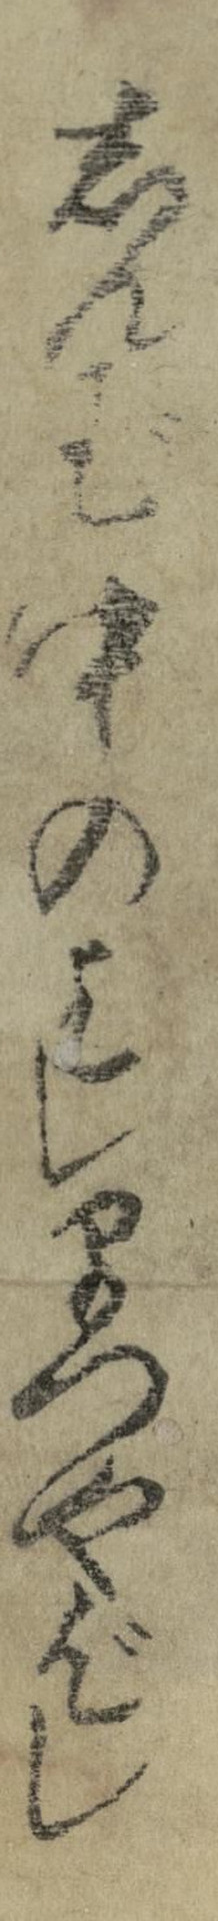しんは中のはしまつやばし
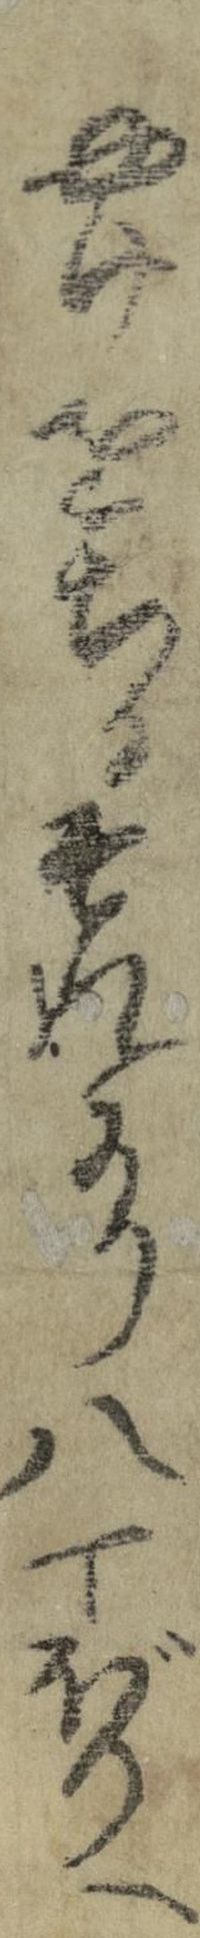やけをちるそれより八丁ぼりへ
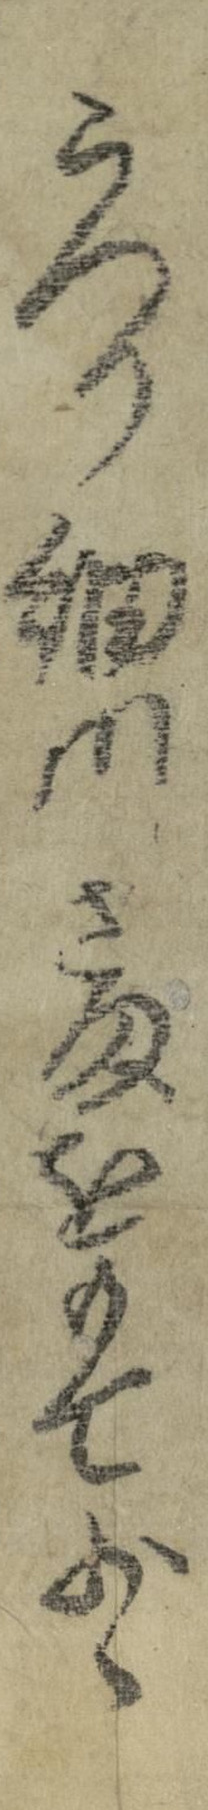うつり細川さまをもて少々
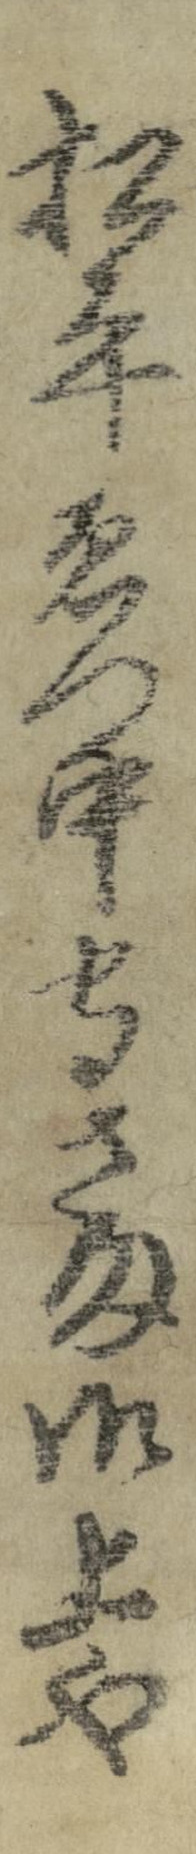松平ゑつちうさま御上な
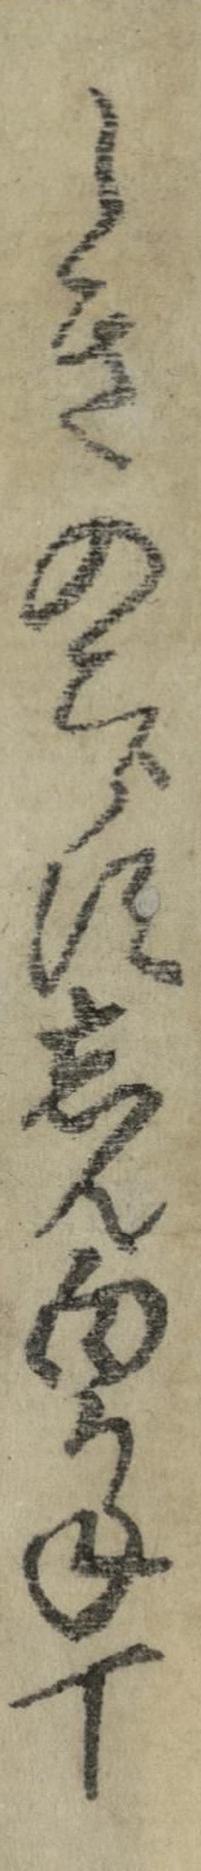しきのこらずしん白かね丁
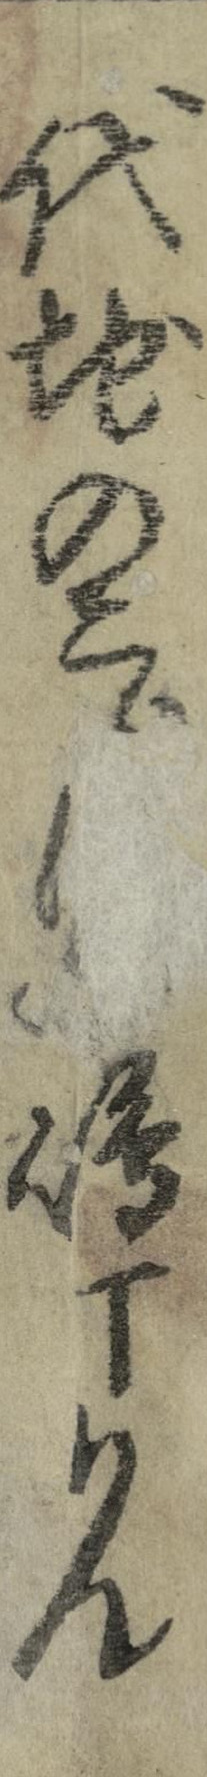代地のこらず嶋丁りん
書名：焼場方角場所附
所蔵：東京大学地震研究所図書室 Earthquake Research Institute Library, The University of Tokyo, JAPAN
